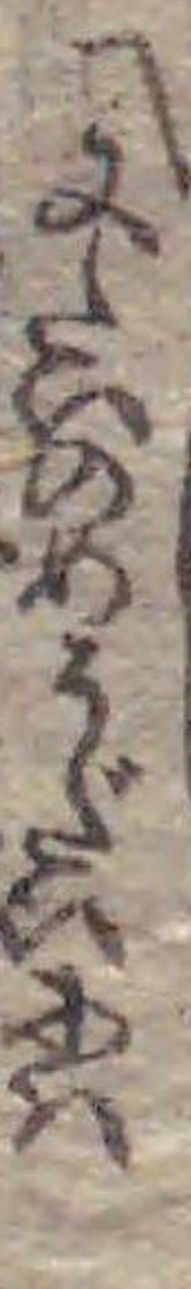〽又たいのめうだいには
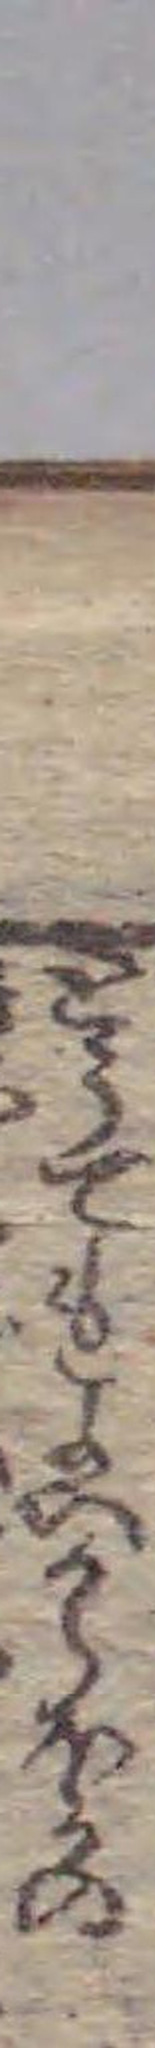どうてもこよいからほかの
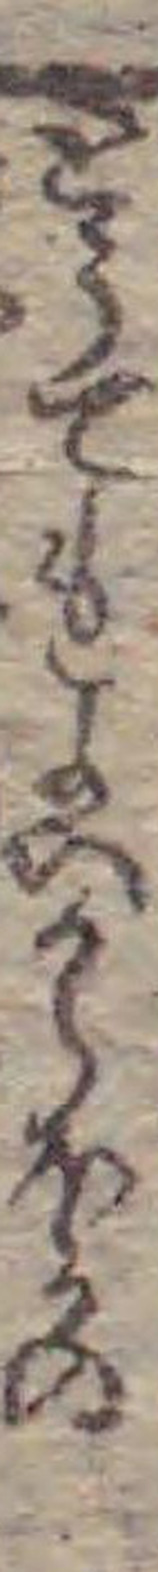どうてもこよいからほかの
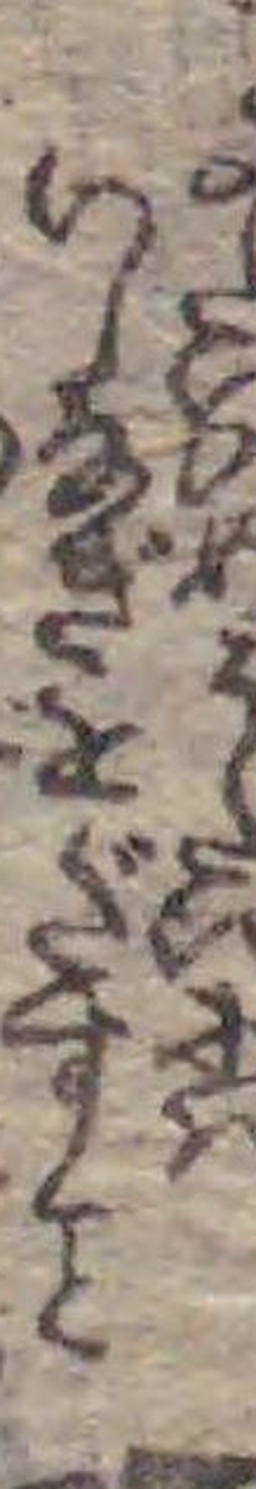いしなぎをだすこと
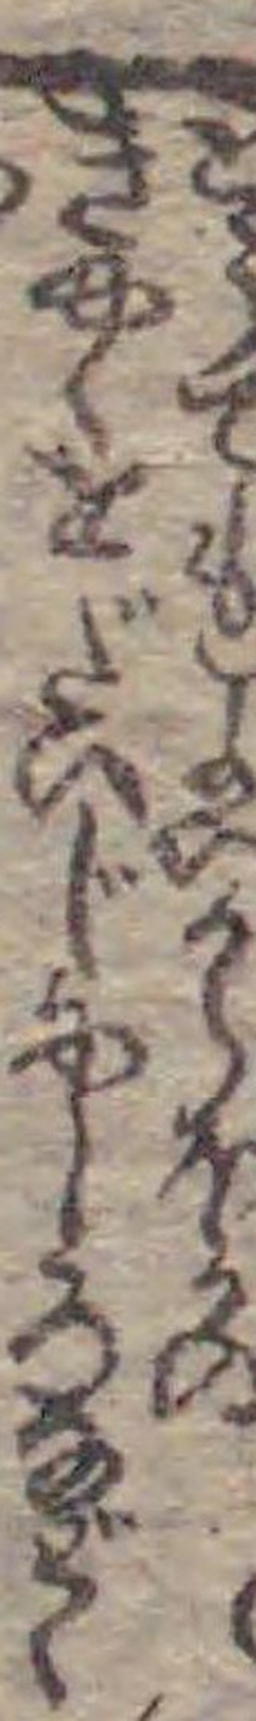きやくをだいじにしろなどゝ
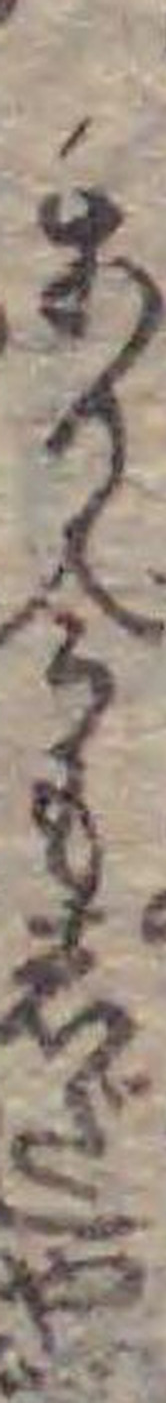あり今もしだしやで
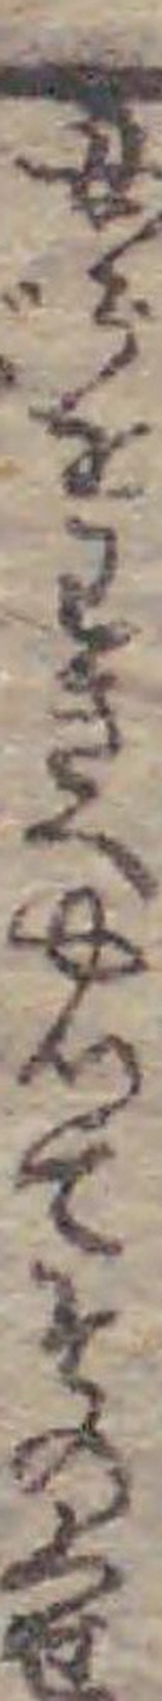女郎をわきへやつてそのくせ
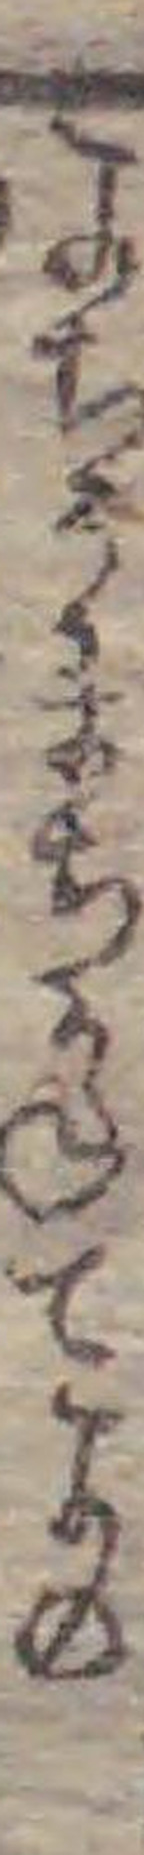よぢうまちかねてよの
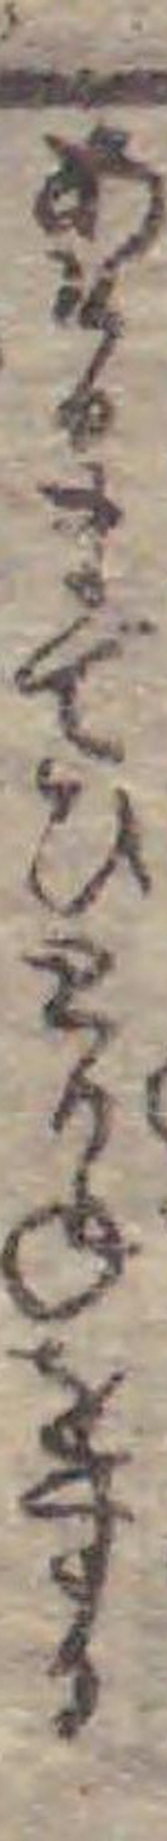あけるまでひとりねをする
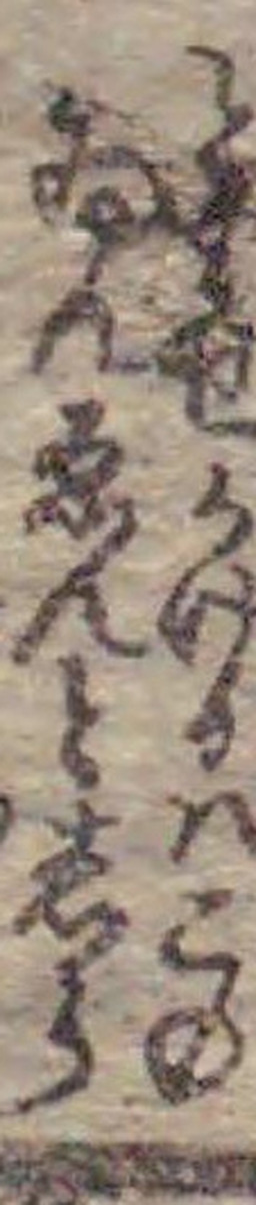ゐんゑんとしら
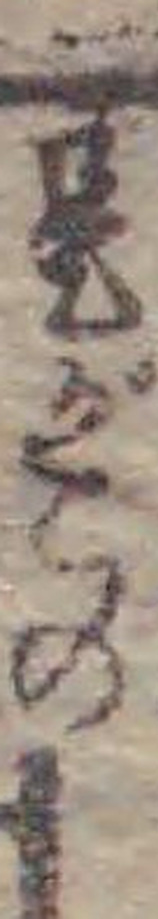是がこの
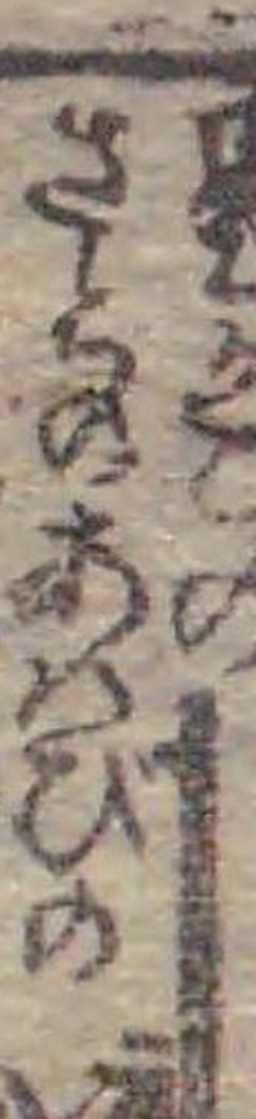さとのあはびの
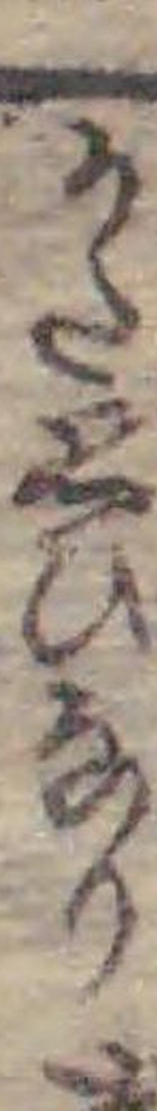かた思ひなり

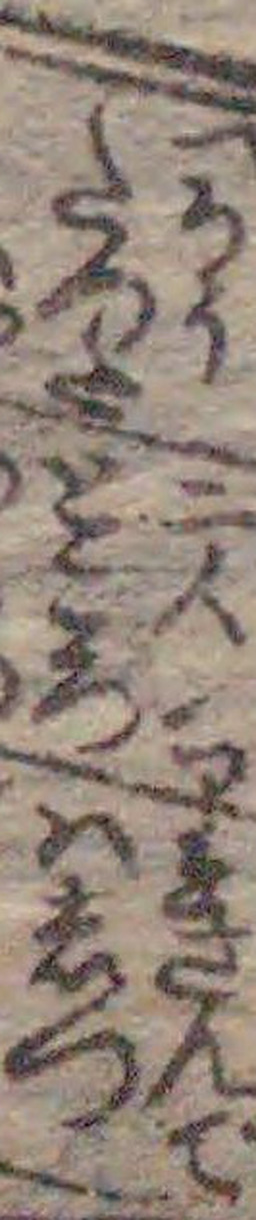たつたところはしつ
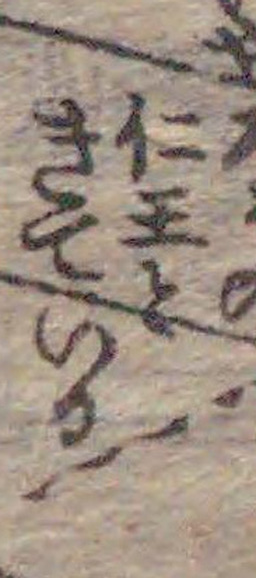きている
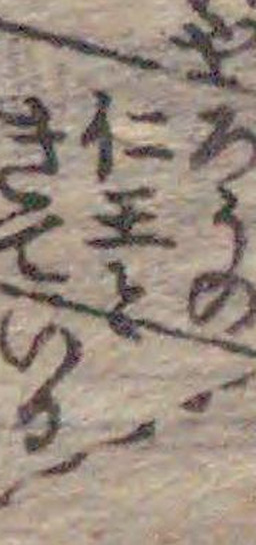きている
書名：竜宮苦界玉手箱 : 3巻
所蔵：国立国会図書館 National Diet Library, JAPAN
